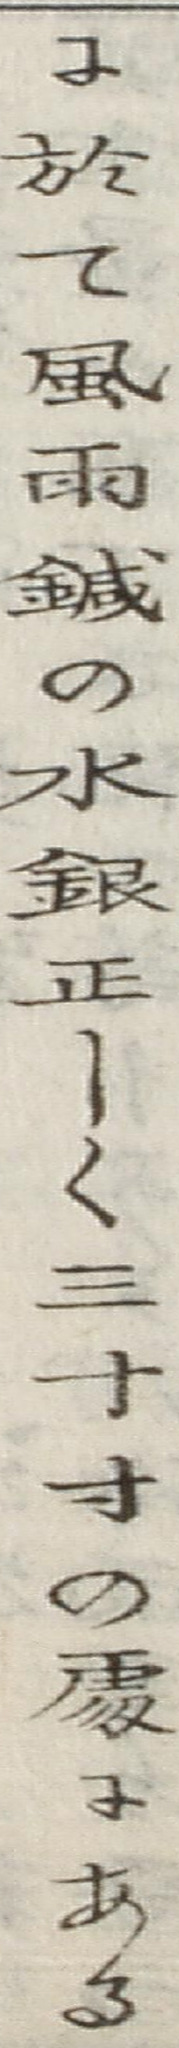に於て、風雨針の水銀正しく三十寸の処にある
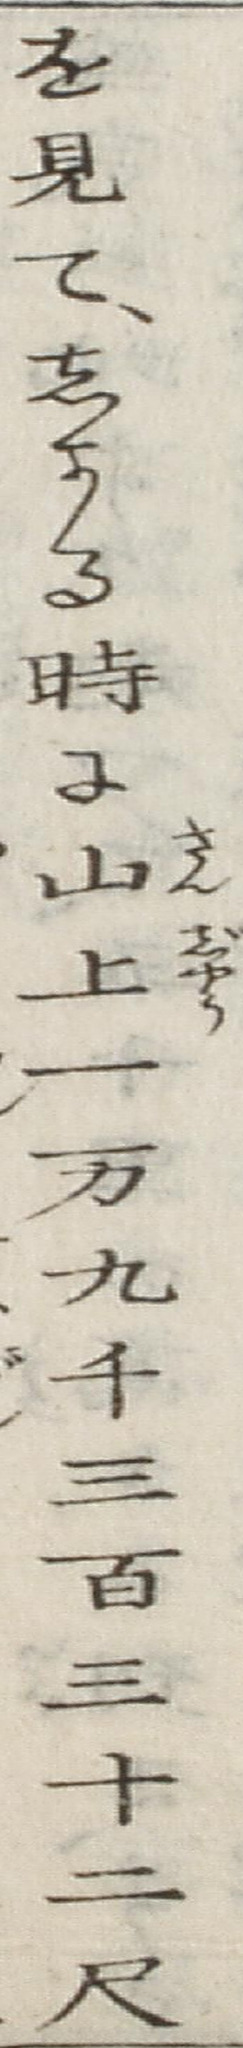を見て、しかる時に山上一万九千三百三十二尺
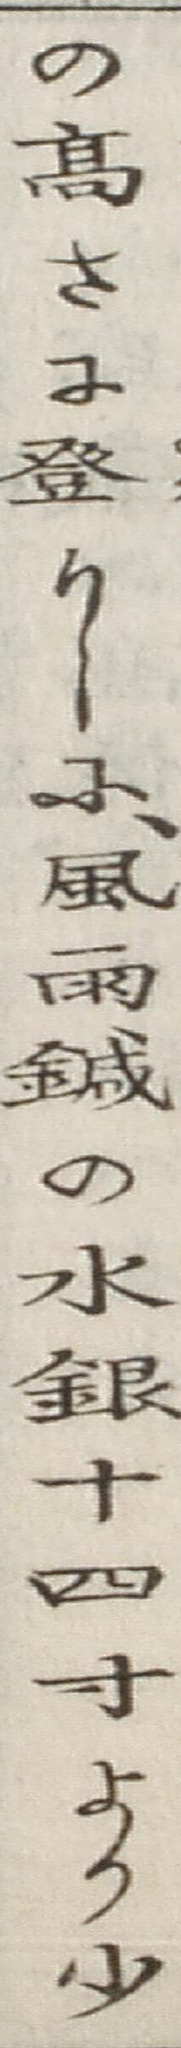の高さに登りしに、風雨針の水銀十四寸より少
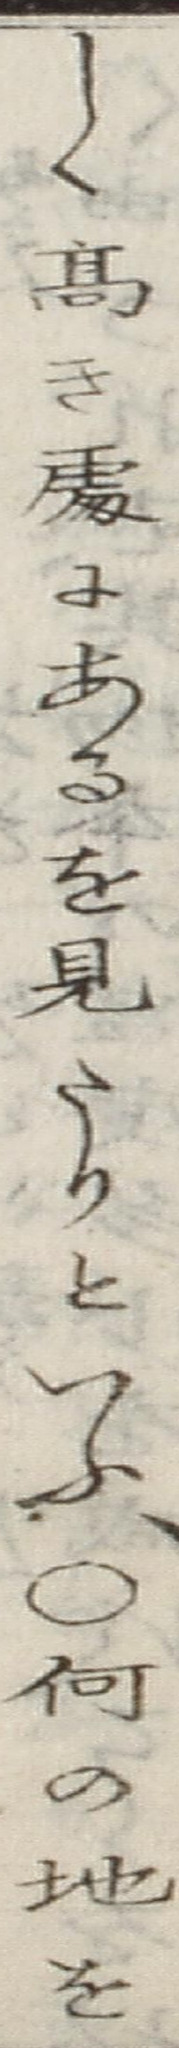しく高き処にあるを見たりといふ、○何の地を
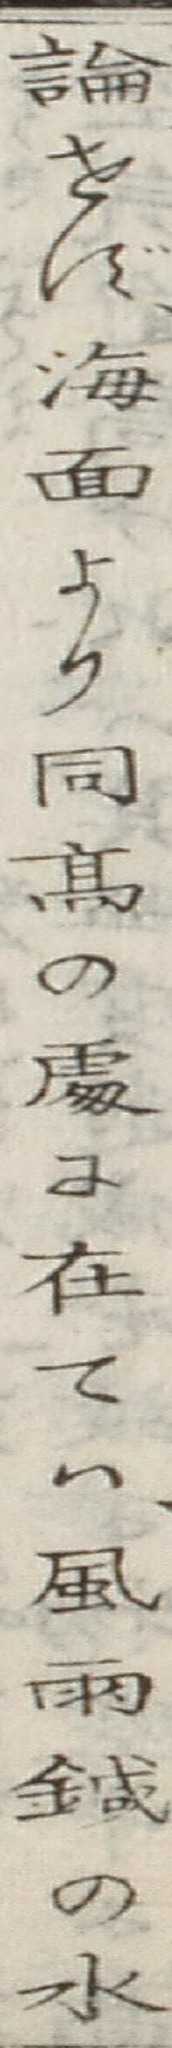論せず、海面より同高の処に在ては、風雨針の水
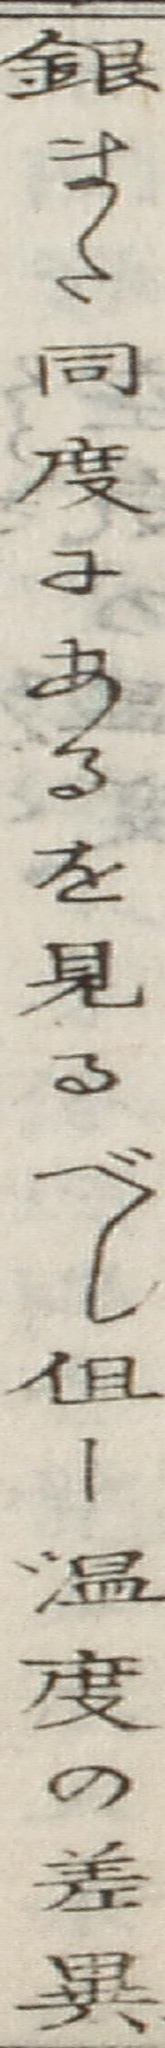銀また同度にあるを見るべし、但し温度の差異、
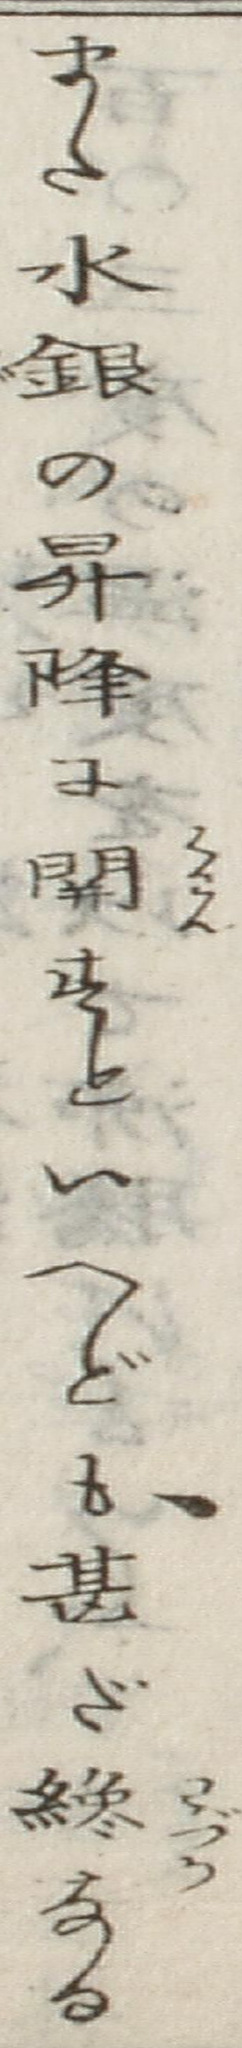また水銀の昇降に関すといへども、甚だ僅なる
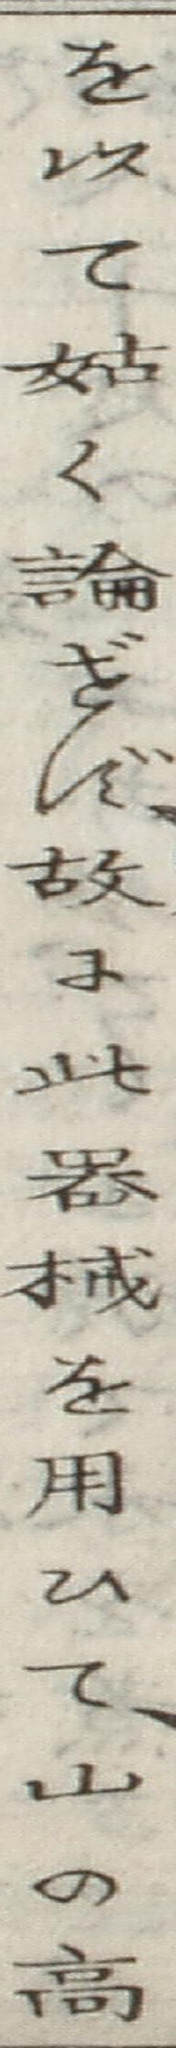を以て姑く論ぜす、故に此器械を用ひて、山の高
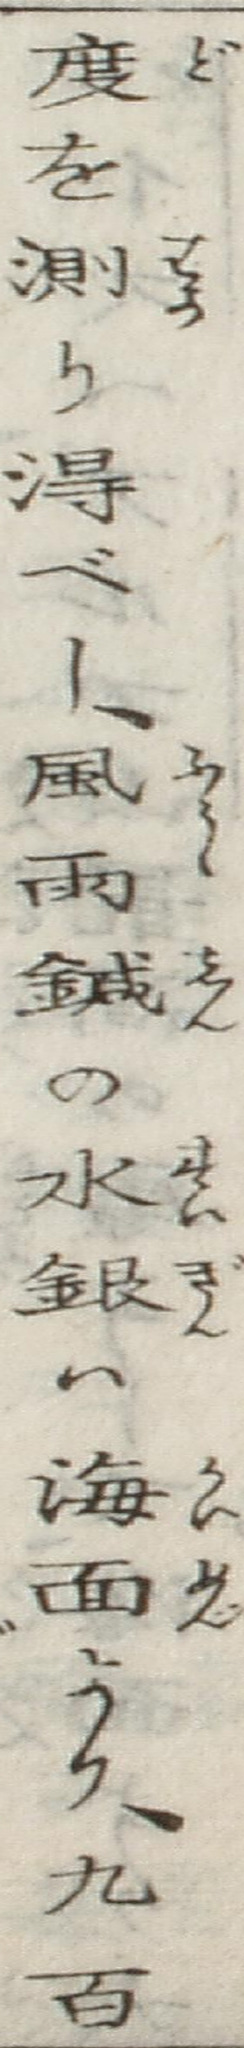度を測り得べし、風雨針の水銀は海面より、九百
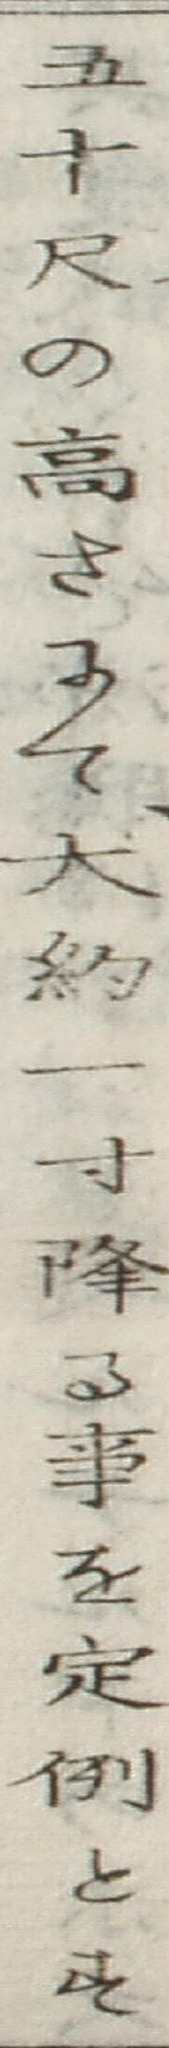五十尺の高さにて、大約一寸降る事を定例とす
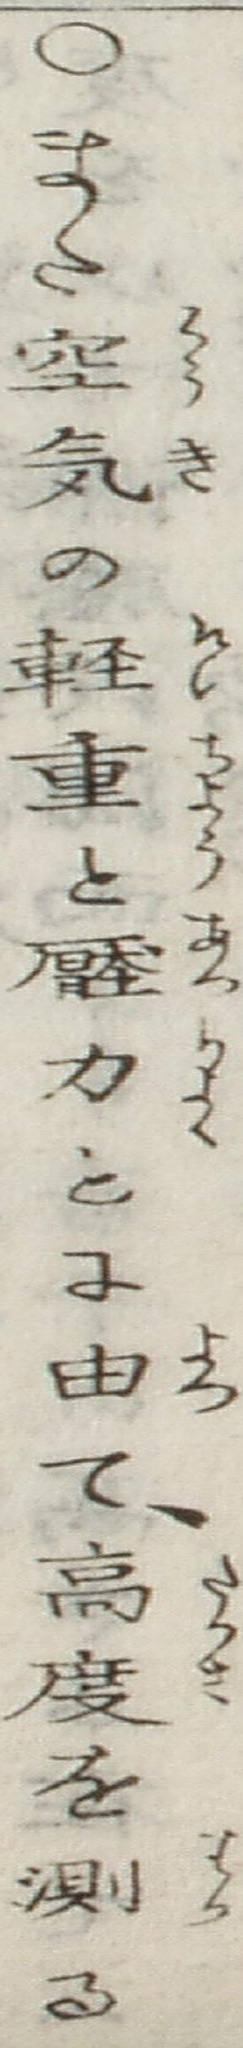○また空気の軽重と圧力とに由て、高度を測る
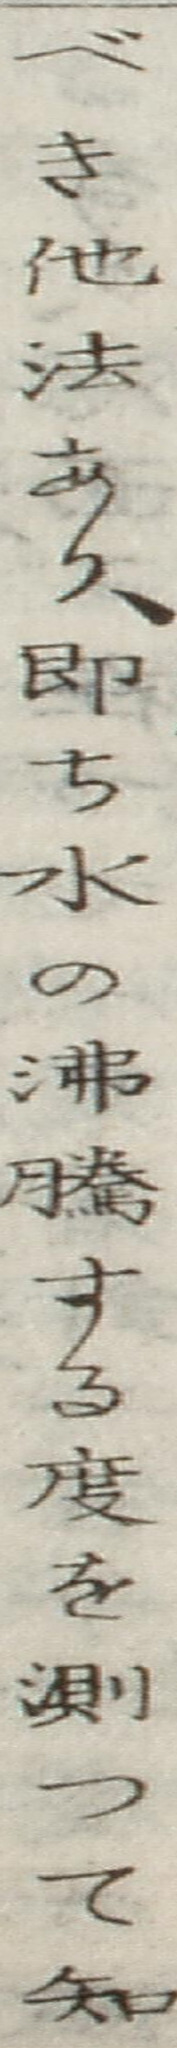べき他法あり、即ち水の沸騰する度を測つて知

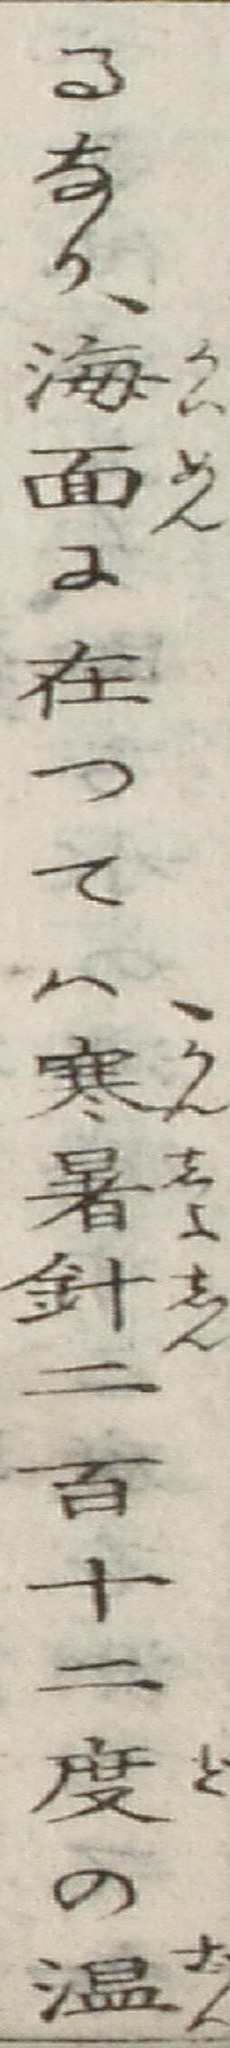るなり、海面に在つては、寒暑針二百十二度の温
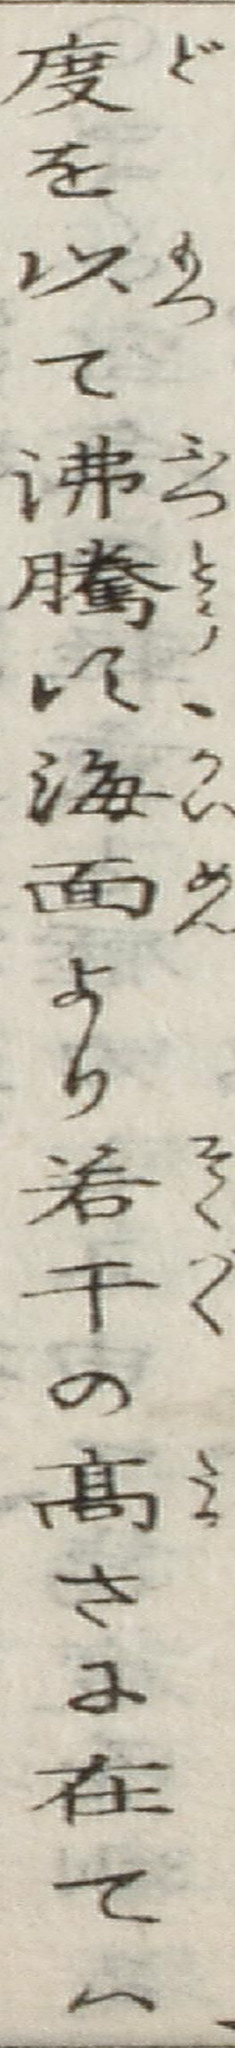度を以て沸騰す、海面より若干の高さに在ては、
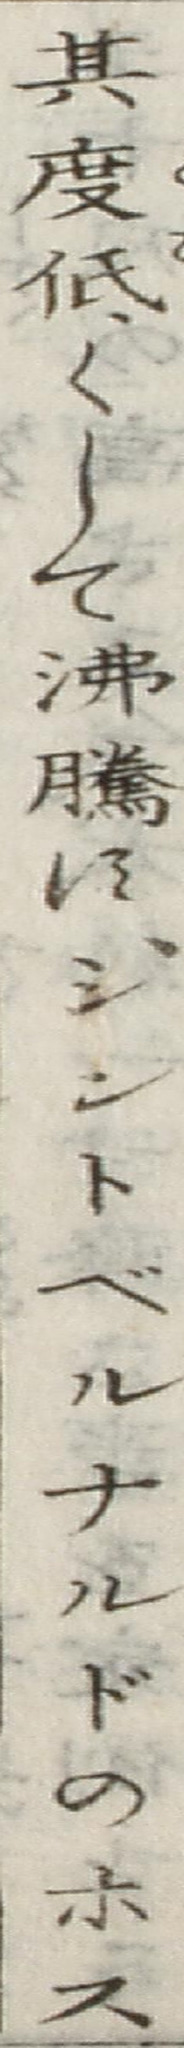其度低くして沸騰す、シントベルナルドのホス
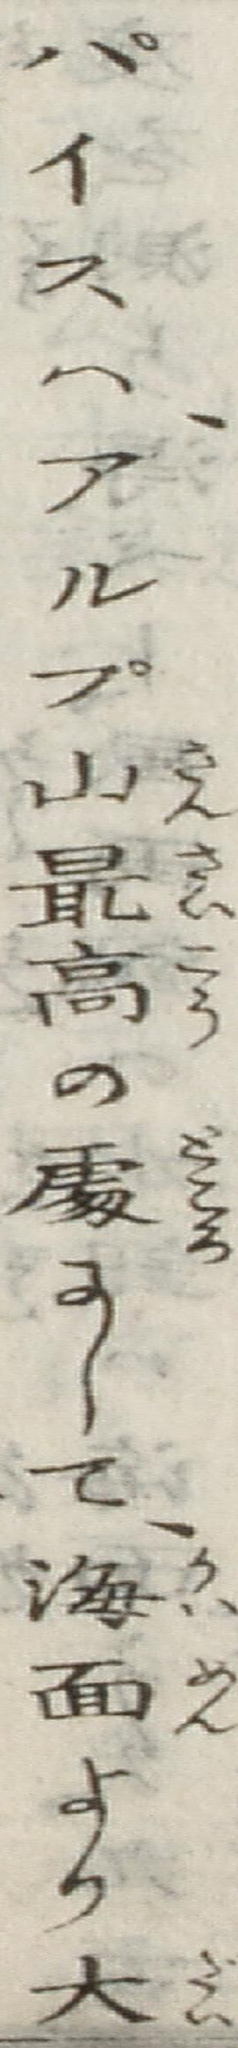パイスは、アルプ山最高の処にして、海面より大
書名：訓蒙　天然地理學　中
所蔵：東京大学地震研究所図書室 Earthquake Research Institute Library, The University of Tokyo, JAPAN
